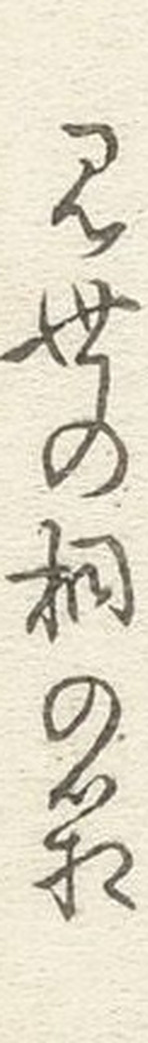見世の桐の箱
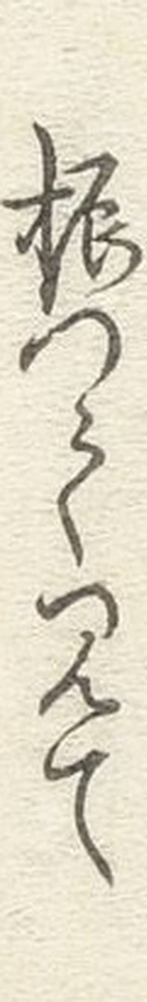振つて見て
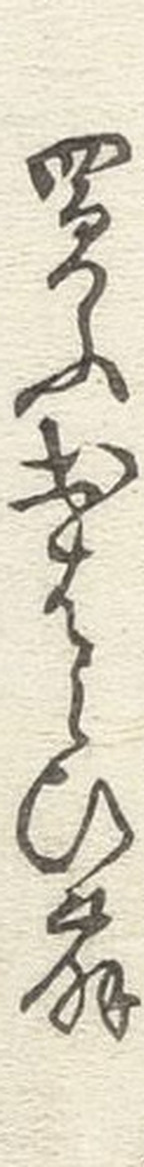買ふおはらひ扇
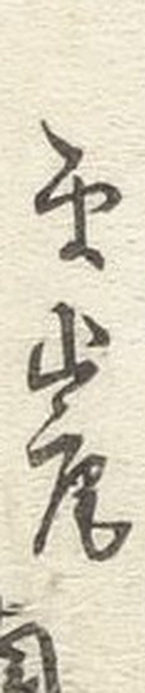平山庵

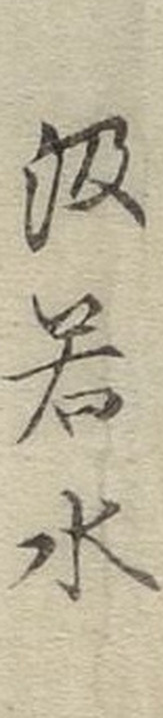汲若水
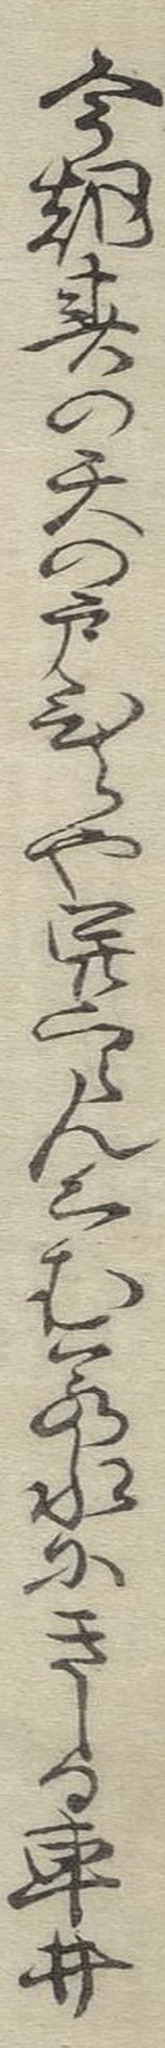今朝春の天の戸ひらや開くらんくむ若水にきし
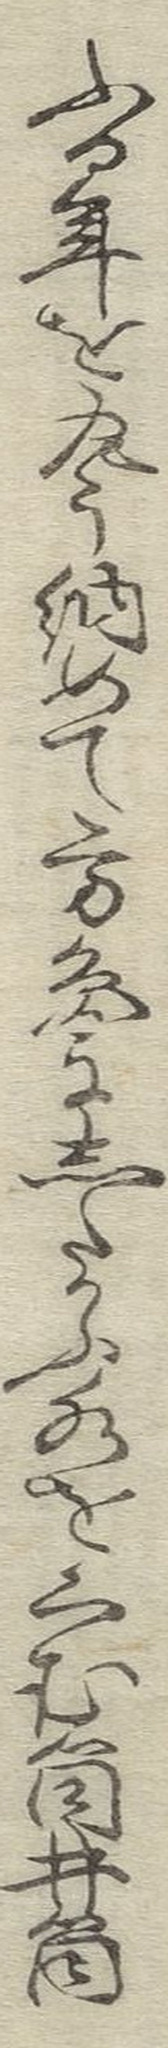ふる年を丸う納めて方円にしたかふ水をくむ筒
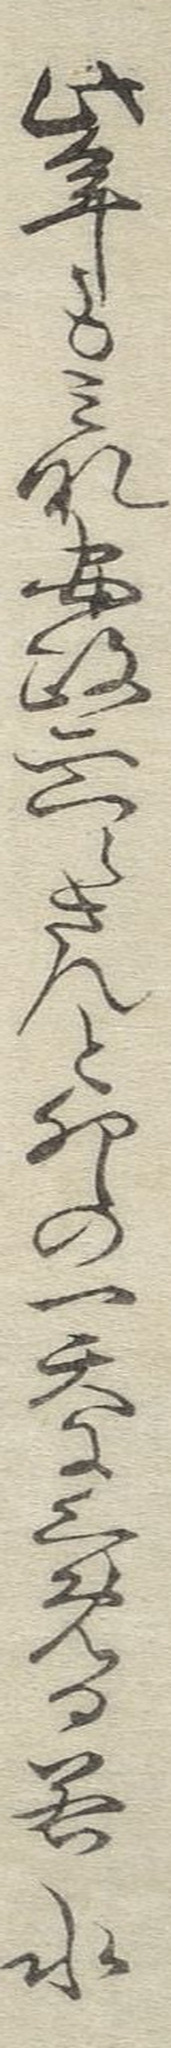此年もみな安政にくらさんと卯の一天にくめる
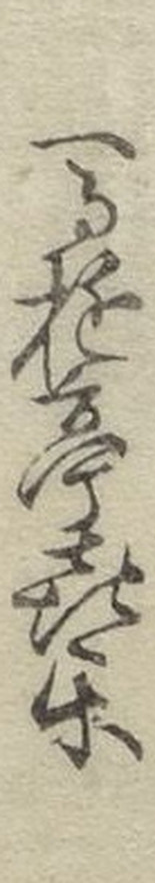若水馬遊亭喜楽
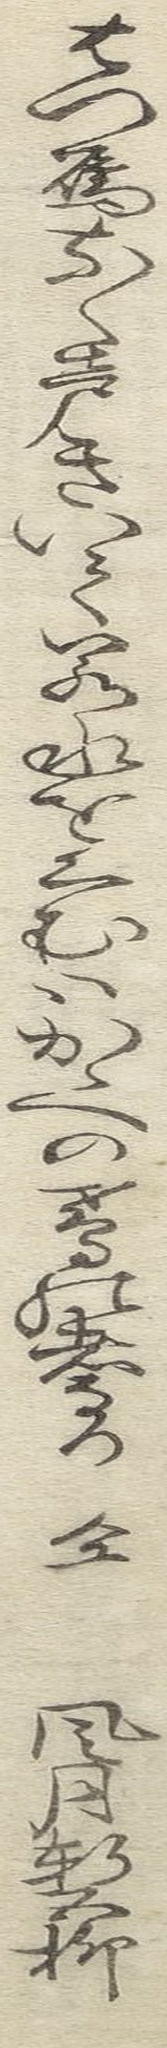はつ雀なく声きいて若水をくむはかゝへの鳶の
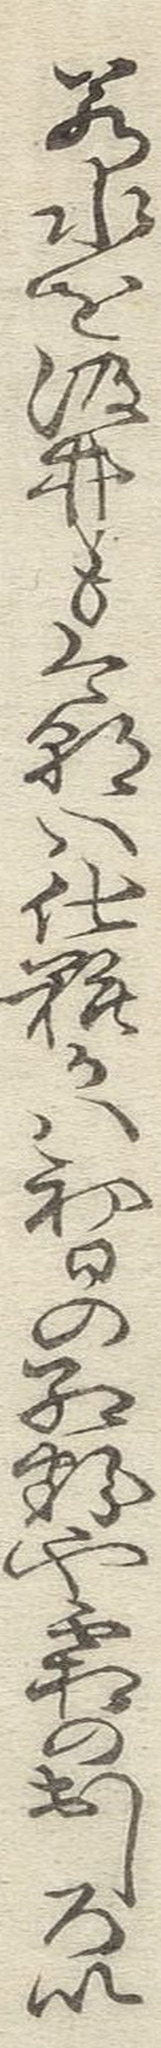若水を汲井も今朝は化粧かは初日の紅粉や霜の
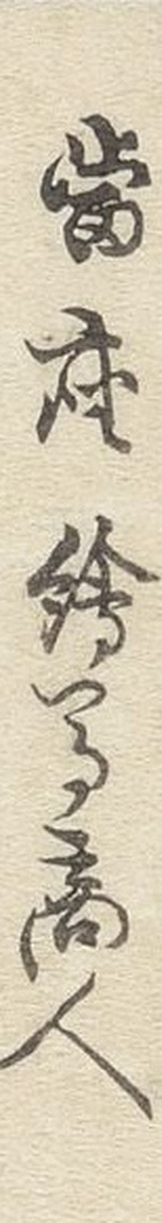当座絵馬商人
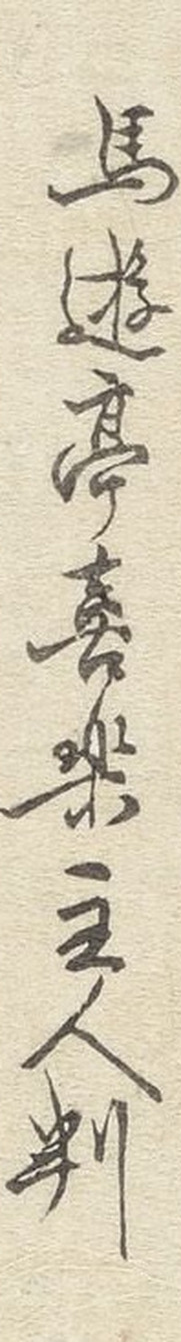馬遊亭喜楽主人判
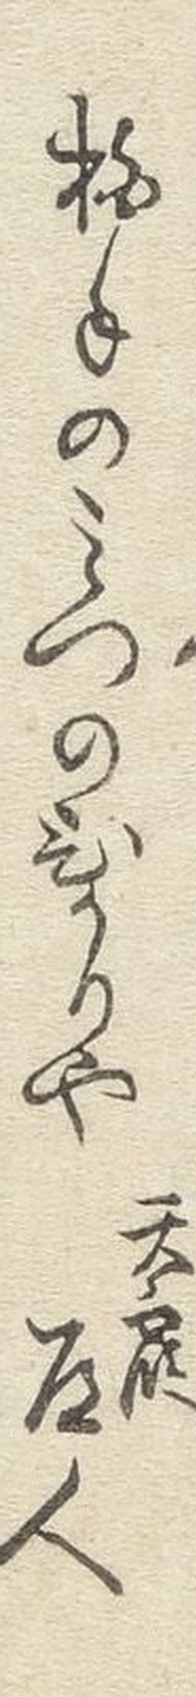柏手のみつのひかりや道人
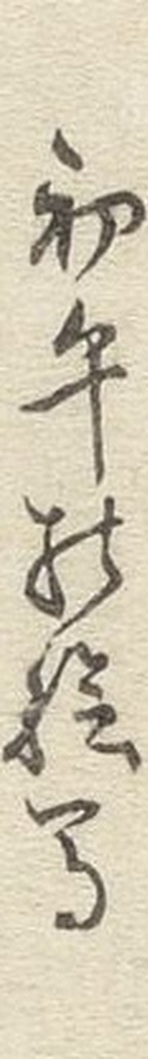初午の絵馬
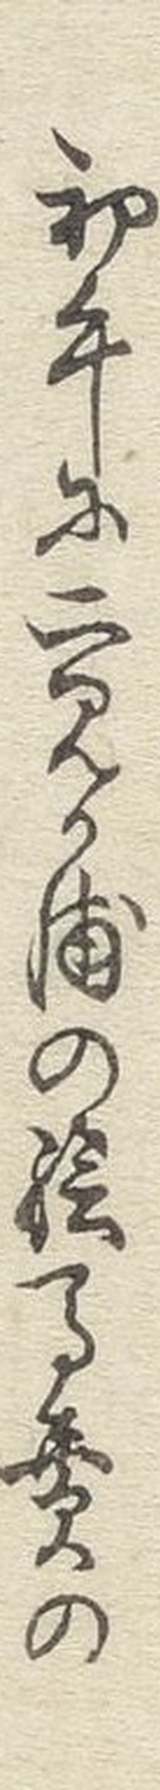初午に二見か浦の絵馬売の
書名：Picture Album of People with Kyōka (Light Verse) (Kyōka shiki jinbutsu 狂歌四季人物)
